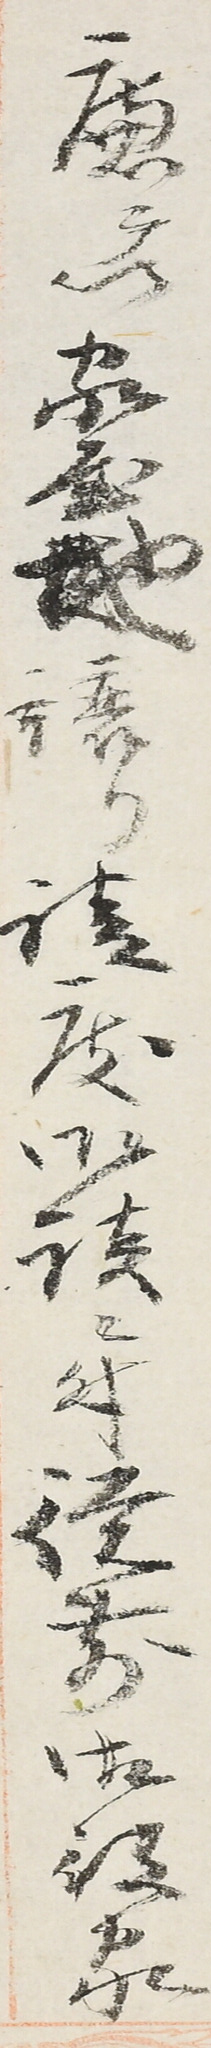廉ヲ以家屋地譲り請度御談ニ付従前御役家
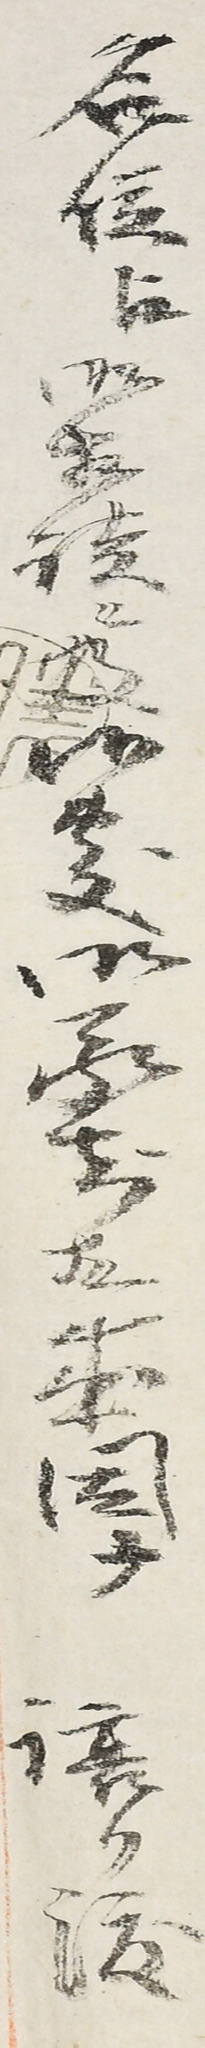各位江御相談ニ及候処御承知相成因テ譲り渡
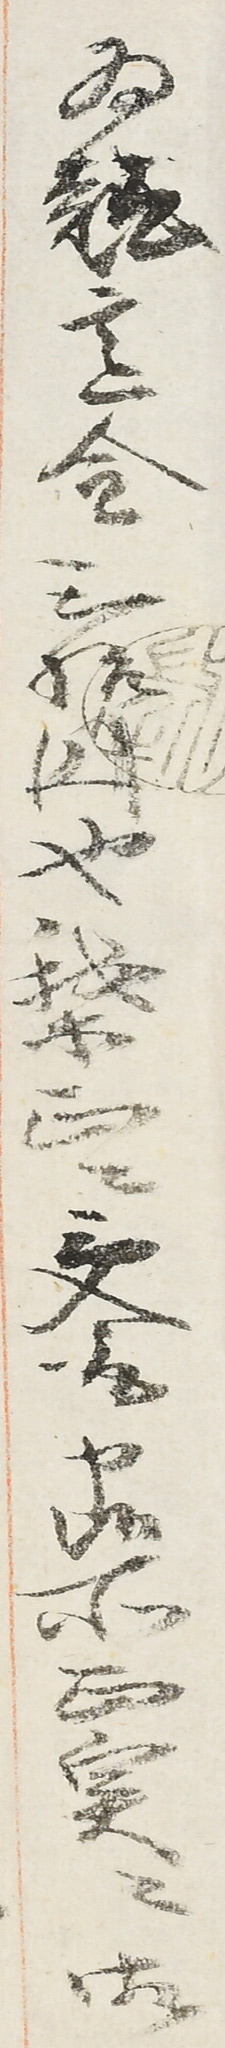為趣意金三拾円也我等正ニ受取申候所正実ニ御
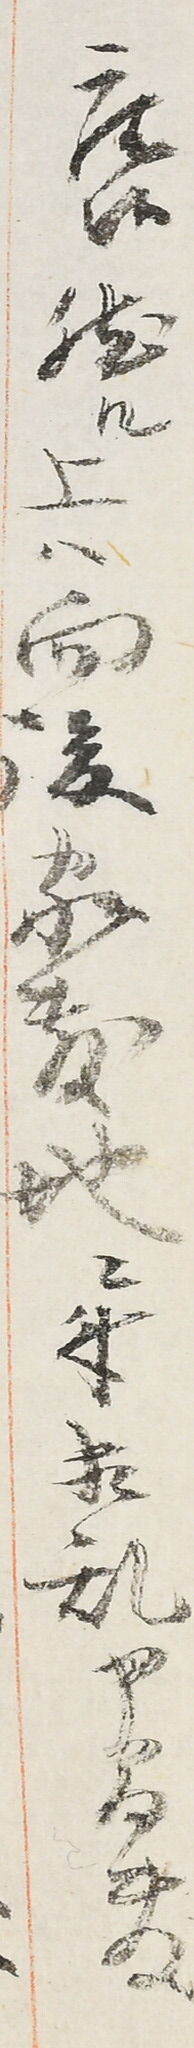座候然ル上ハ向後家敷地ニ付相乱申間敷
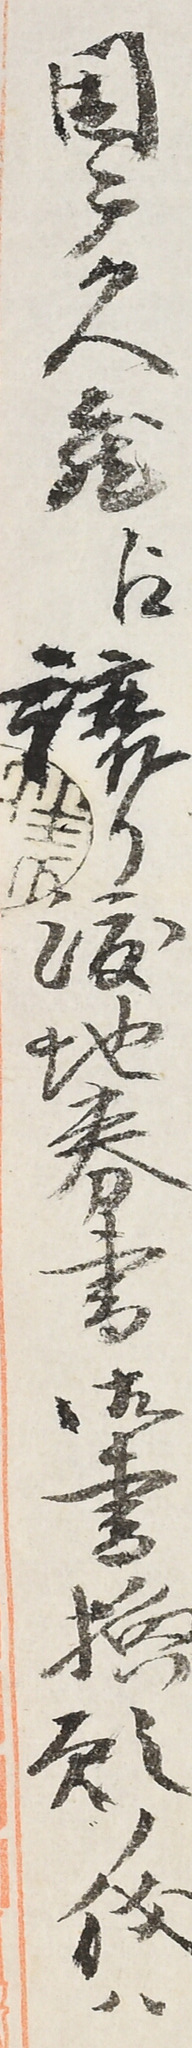因テ久蔵江譲り渡地券書御書換願ノ儀ハ
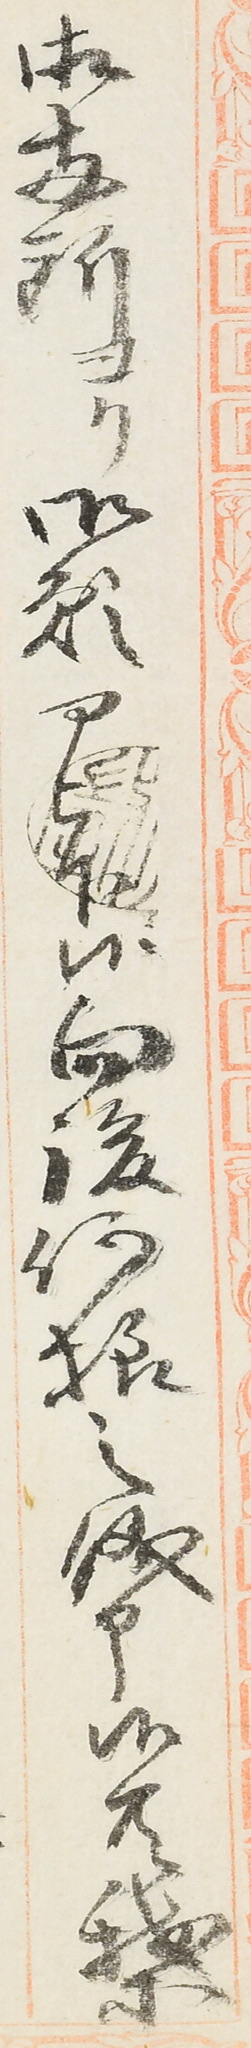御両所ヨリ御願申被下候向後何様之儀申候共我等
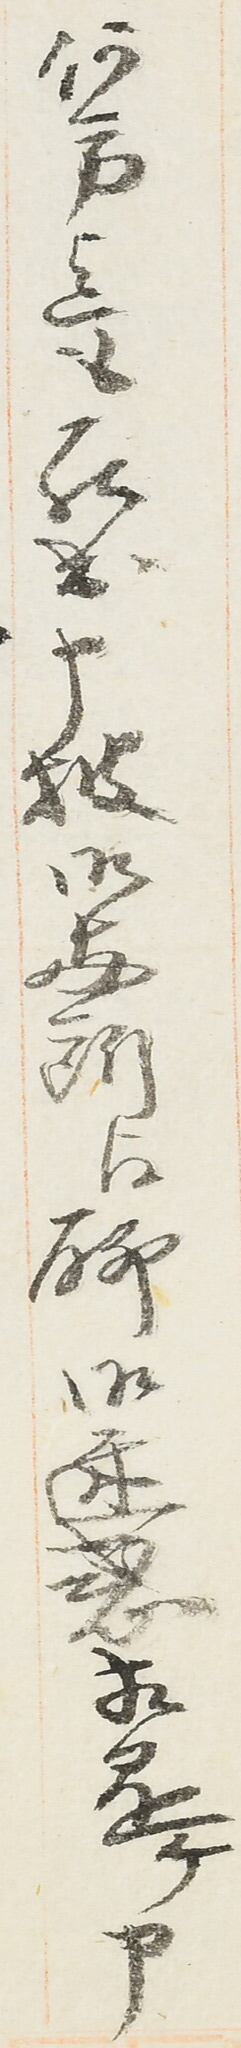何方迠も罷出申披御両所江聊御迷惑相懸ケ申
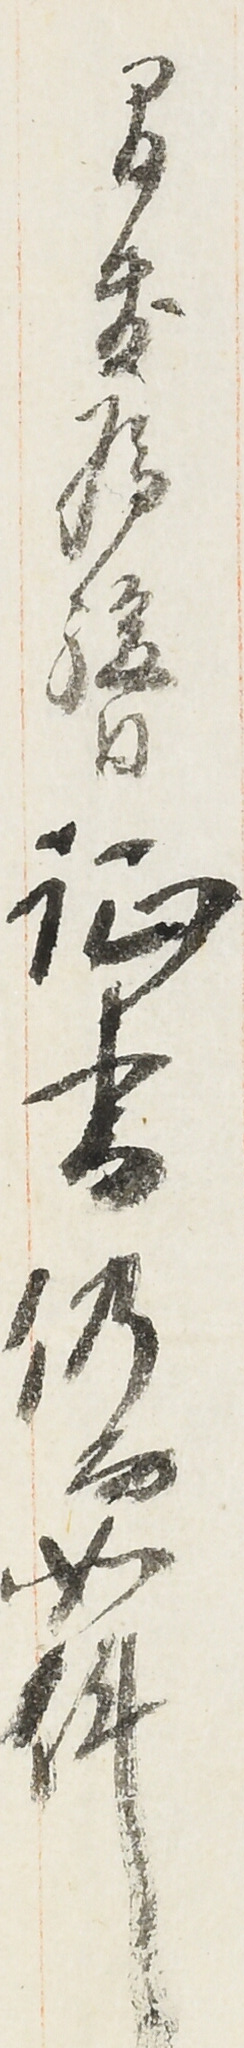間敷為後日証書仍而如件
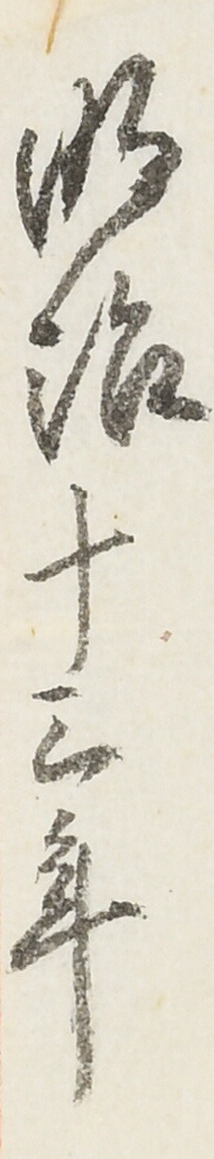明治十三年
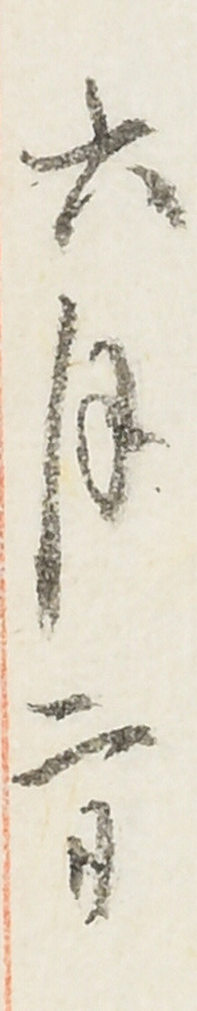六月二日

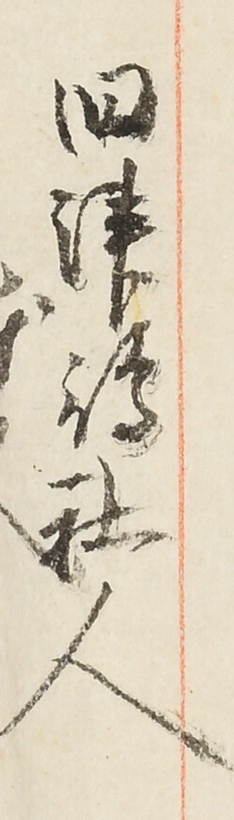旧津嶋社人
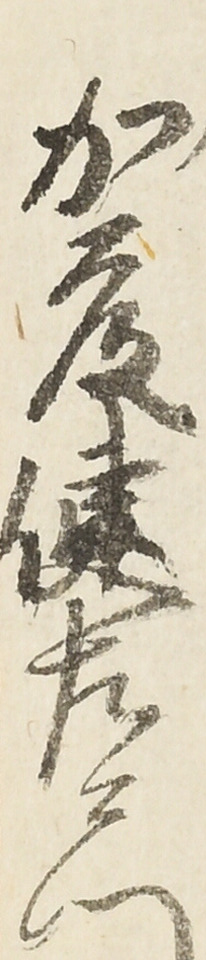加藤健左衛門㊞
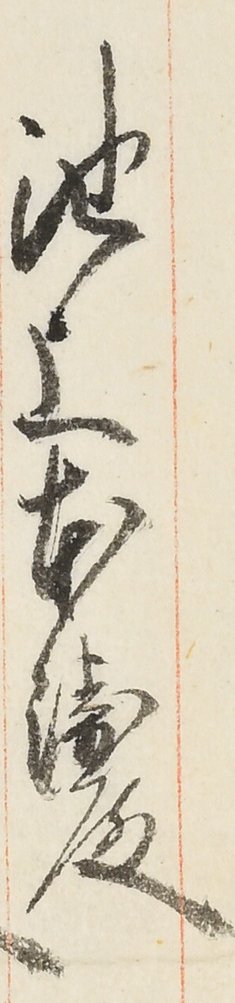池上本衛殿
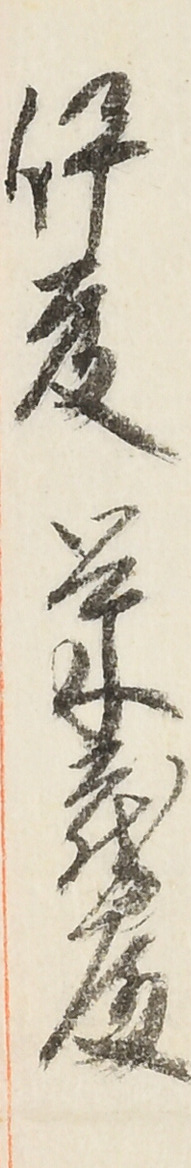伊藤栄蔵殿

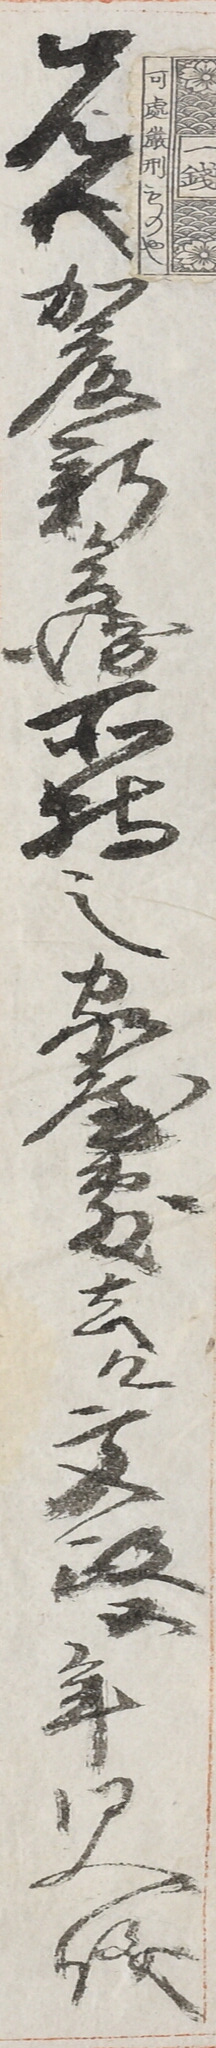先代加藤新兵衛所持之家屋敷去ル文政五年同人儀
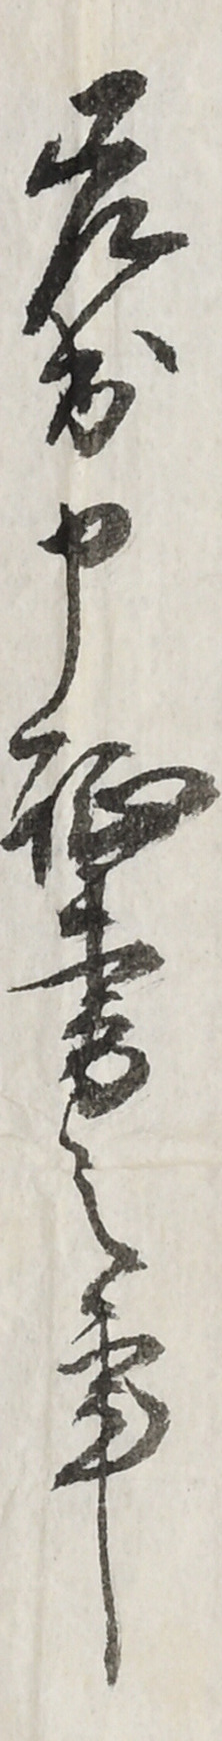差出申証書之事
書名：差出申一札之事
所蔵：伊那市立高遠町図書館・合同会社AMANE
